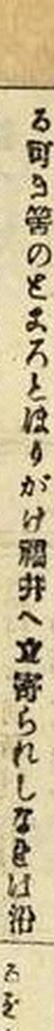る可き筈のところとほりがけ福井へ立寄られしなれは沿
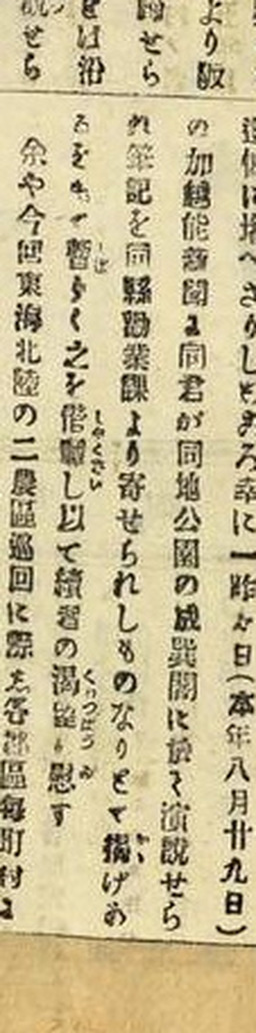れ筆記を同県勧業課より寄せられしものなりとて掲げあ
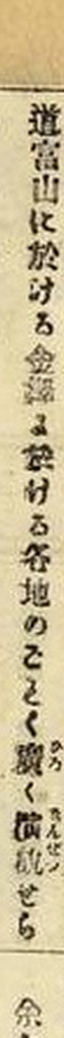道富山に於ける金沢に於ける各地のごとく広く演説せら
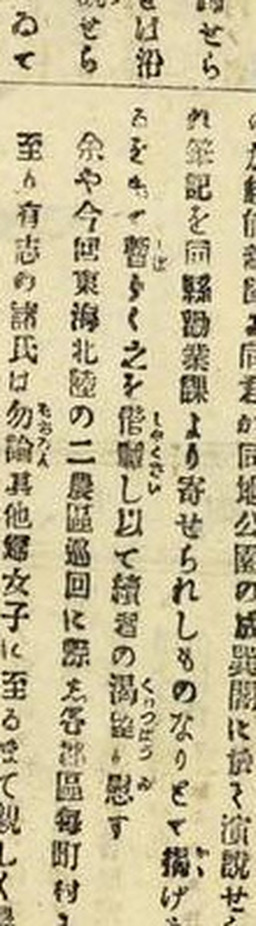るをもて暫らく之を借載し以て読君の渇望を慰す
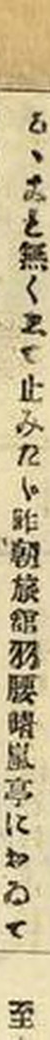るゝこと無くして止みたゞ昨朝旅館羽腰晴嵐亭におゐて
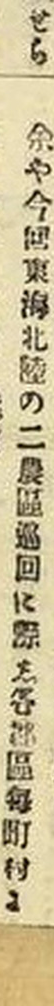余や今回東海北陸の二能農区巡回に際し各郡区毎町村に
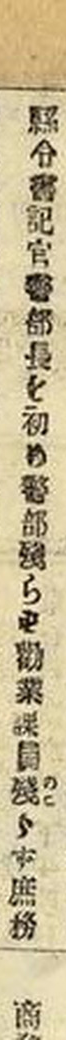県令書記官警部長を初め警部残らすず勧業課員残らず庶務
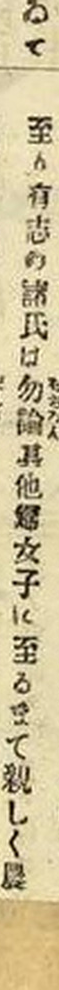至り有志の諸氏は勿論其他婦女子に至るまて親しく農
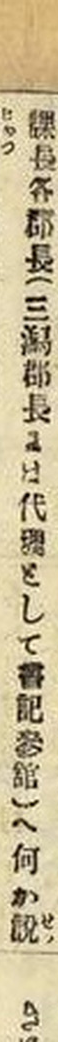課長各郡長三潟郡長には代理として書記参館へ何か説
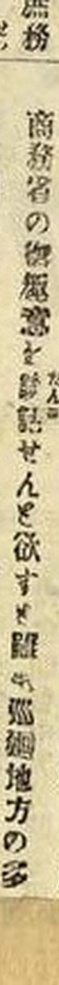商務省の御趣意を談話せんと欲すと雖も巡廻地方の多
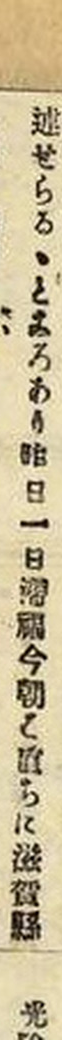述せらるゝところあり昨日一日滞福今朝は直ちに滋賀県
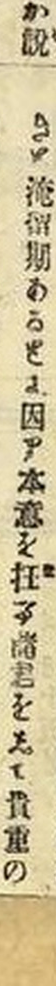きと淹留期あるとに因り本意を枉け諸君をして貴重の
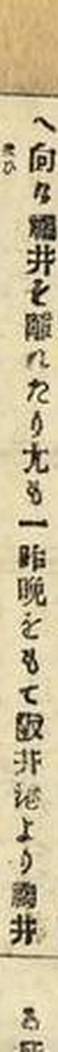へ向け福井を離れたり尤も一昨晩をもて阪井港より福井
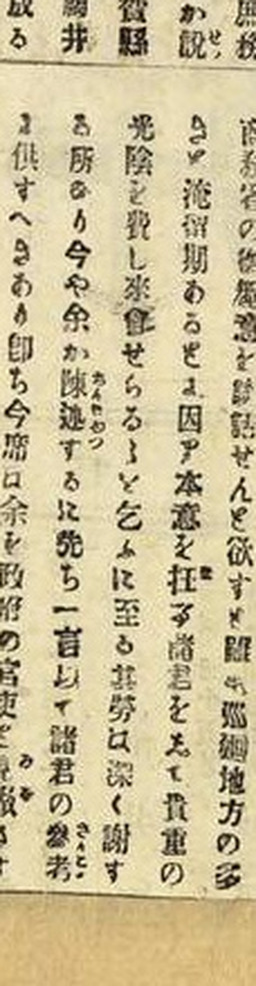光陰を費し来会せらるるゝを乞ふに至る其労は深く謝す
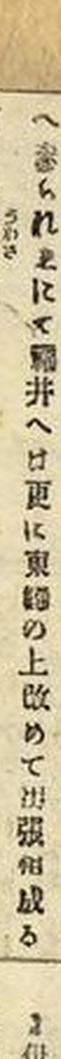へ参られしにて福井へは更に東帰の上改めて出張相成る
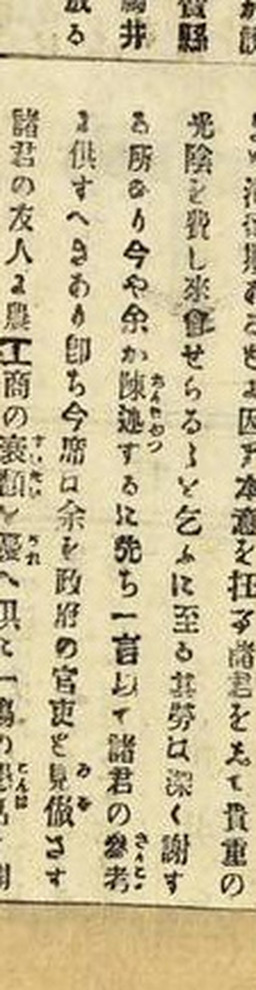る所なり今や余か陳述するに先ち一言以て諸君の参考
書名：温古集 五巻
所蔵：福井県文書館 Fukui Prefectural Archives
